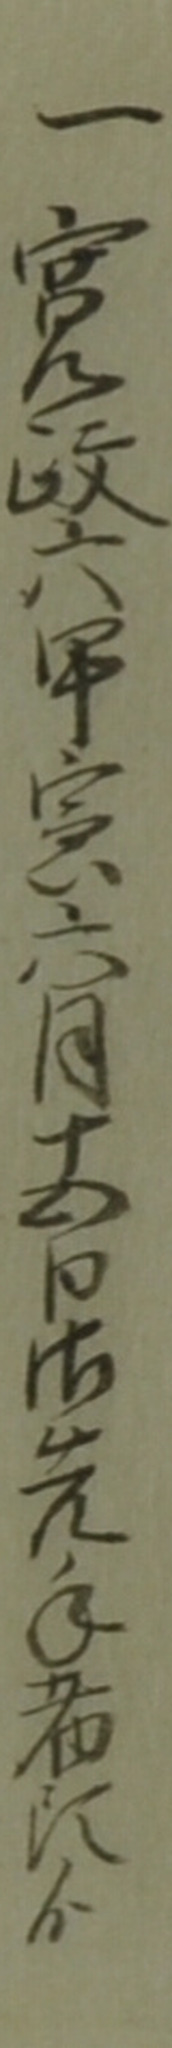一寛政六甲寅六月十五日御先手者頭ゟ
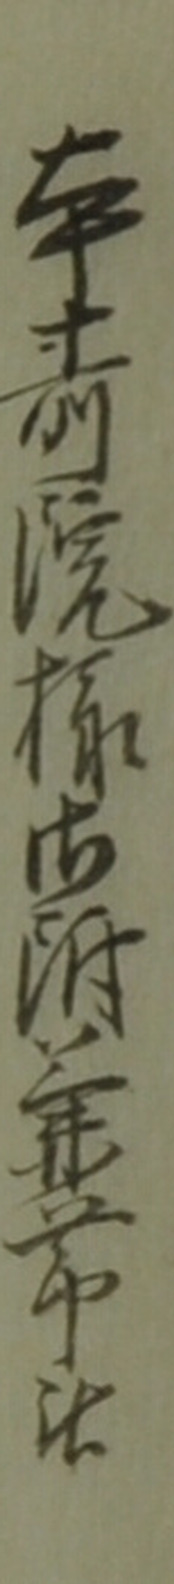本寿院様御附兼帯被
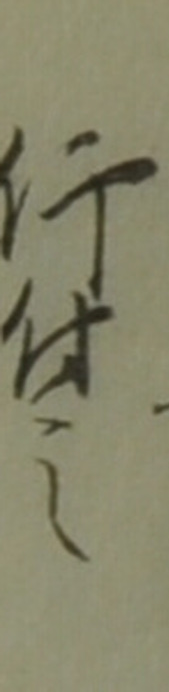仰付之
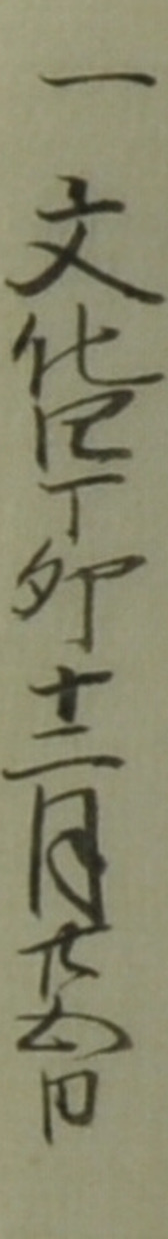一文化四丁卯十二月廿五日

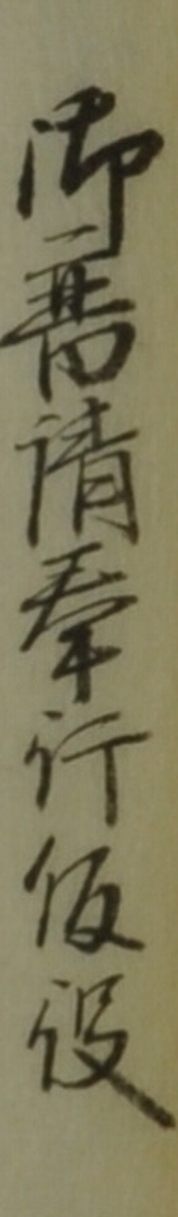御普請奉行仮役
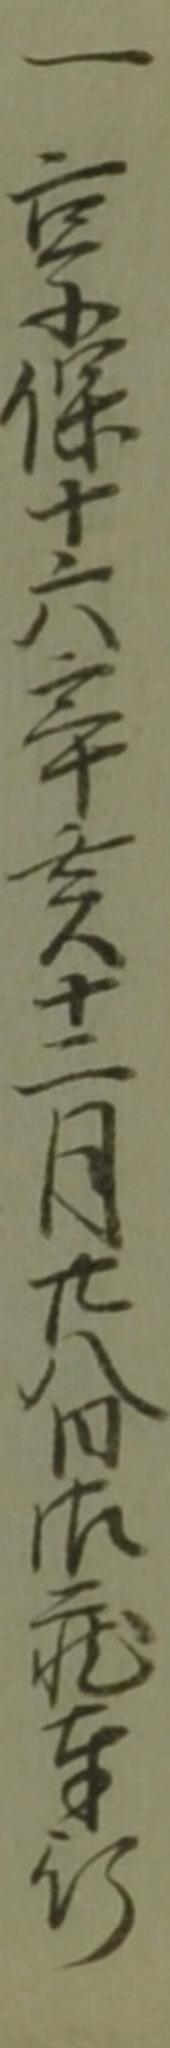一享保十六辛亥十二月廿八日御蔵奉行
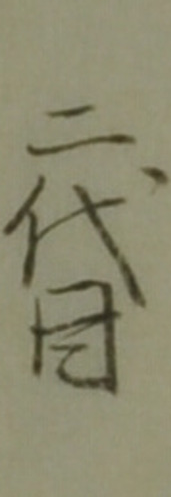二代目
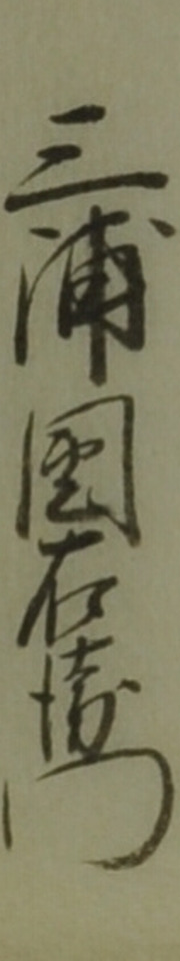三浦団右衛門
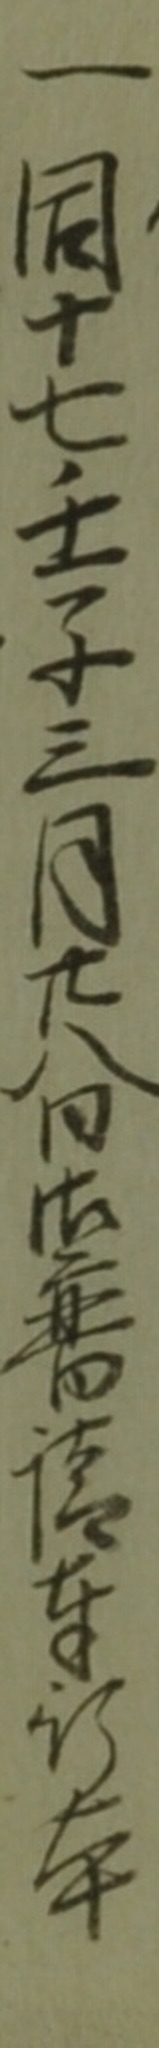一同十七壬子三月廿八日御普請奉行本
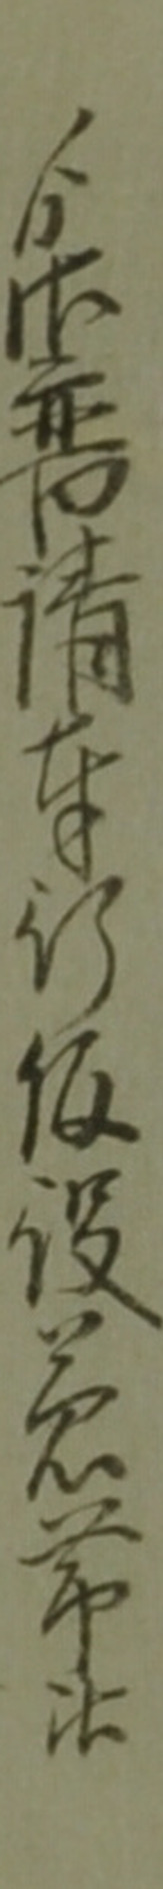ゟ御普請奉行仮役兼帯被
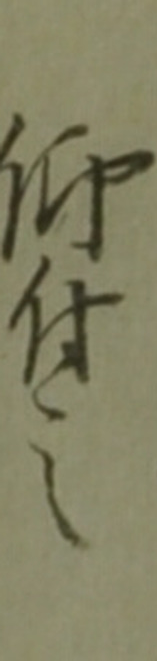仰付之
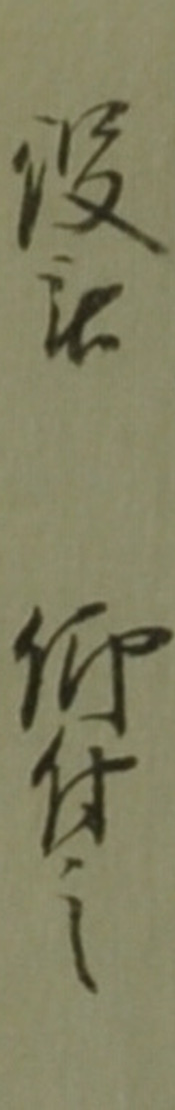役被仰付之
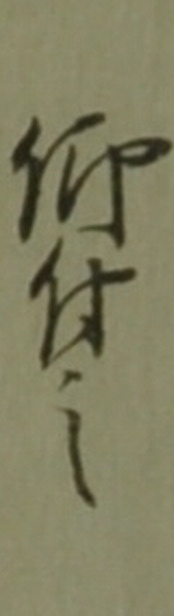仰付之
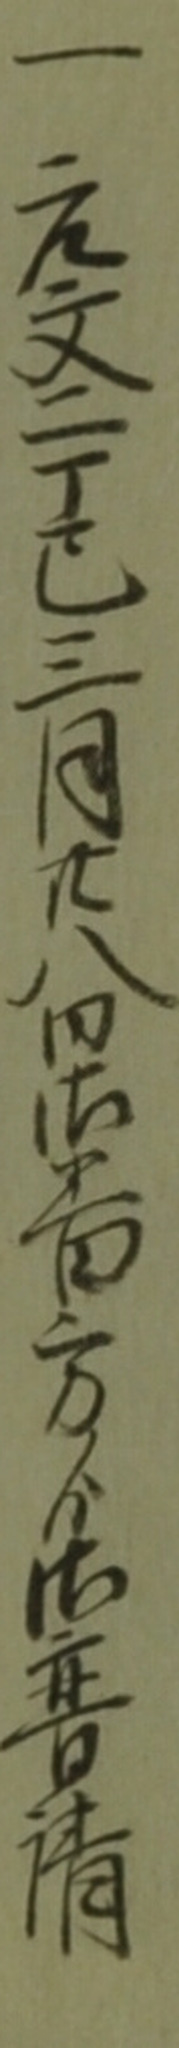一元文二丁巳三月廿八日御番方ゟ御普請
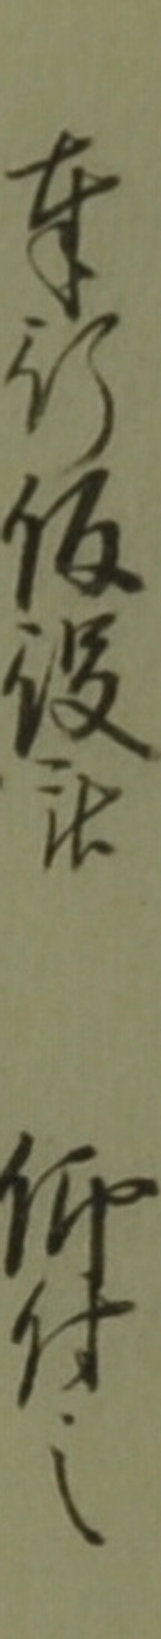奉行仮役被仰付之
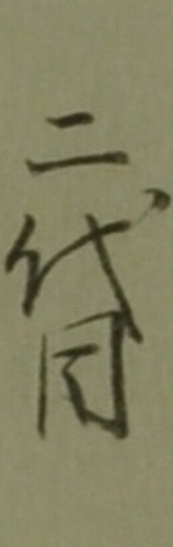二代目
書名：諸御役代々録（六）
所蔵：伊那市立高遠町図書館・合同会社AMANE
